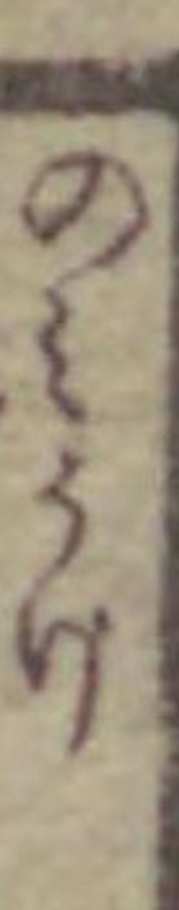のミうけ
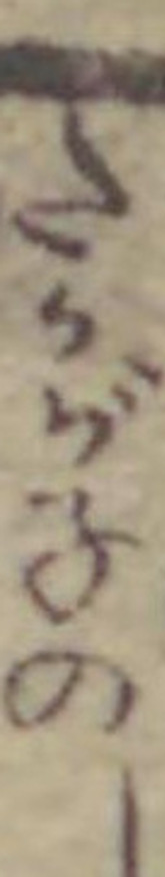たかが子の
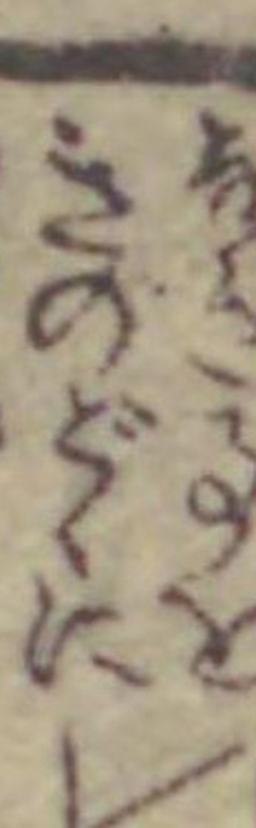きのどくに
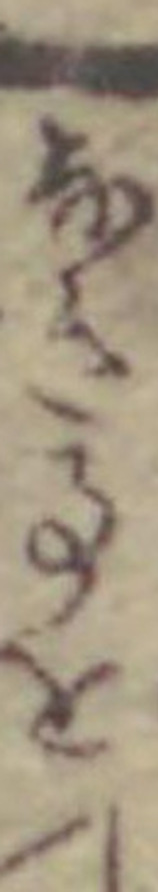なき事を
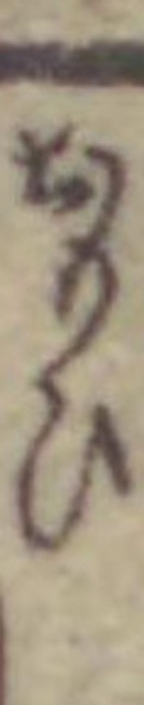おもひ
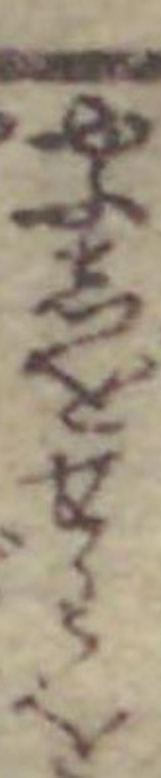やふしをせわを
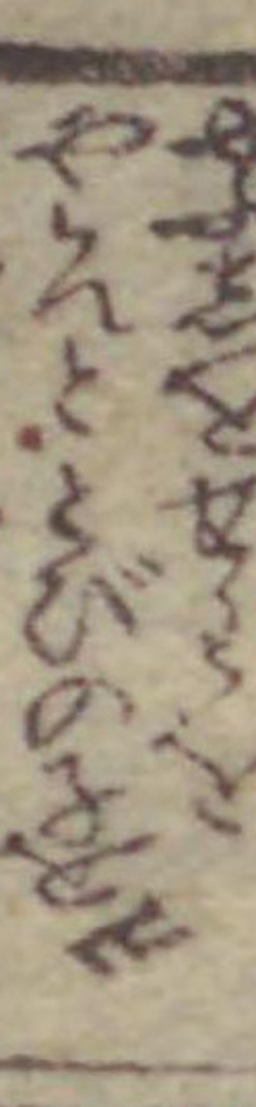やらんととびの子を
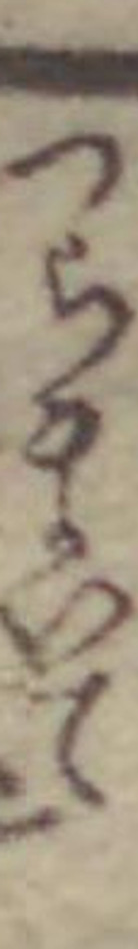つらまいて
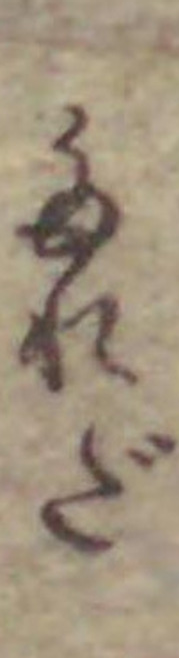たれだ
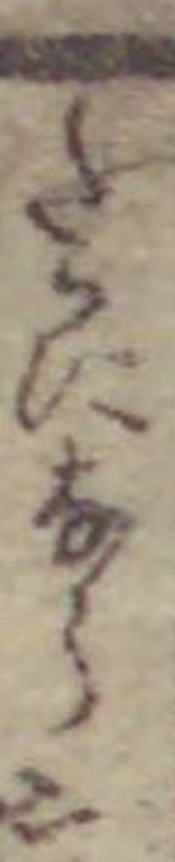たかになら
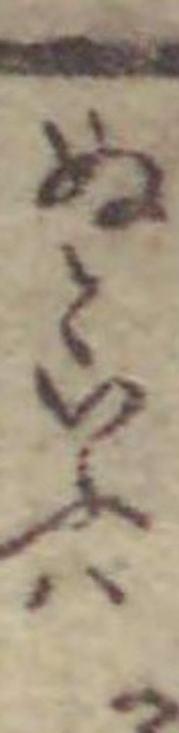ぬといふハ

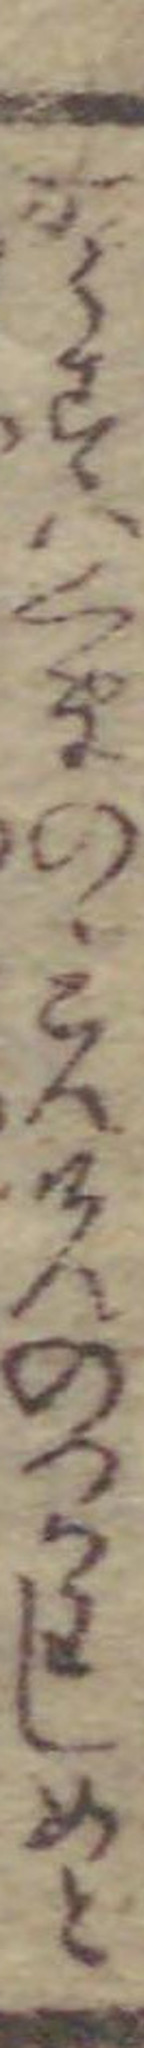からすはくまのゝこんけんのつかわしめと
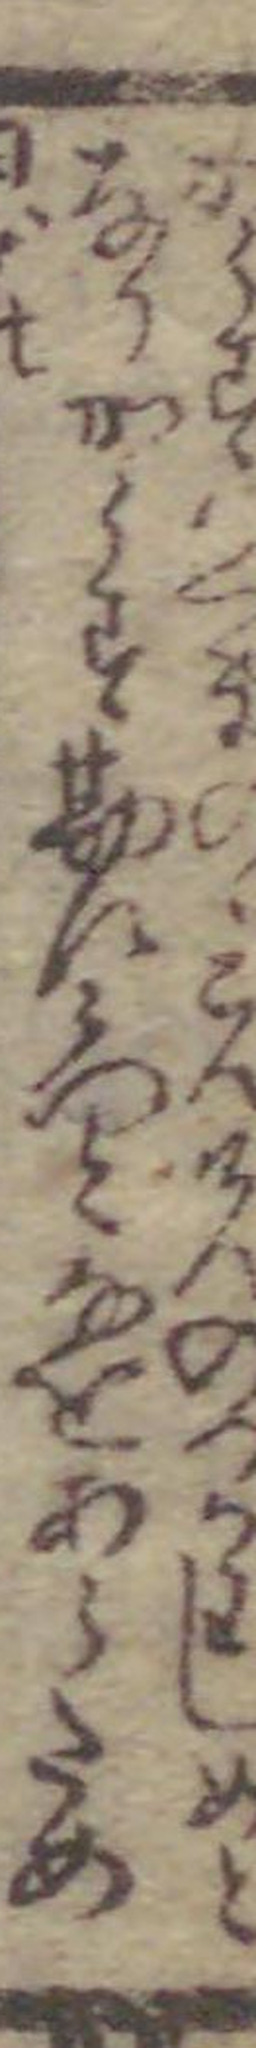なりからす勘左衛門となをあらため
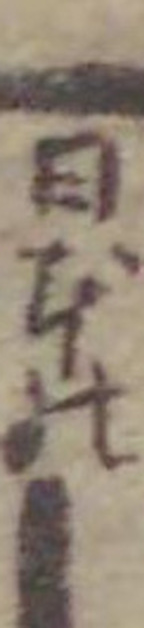日本の
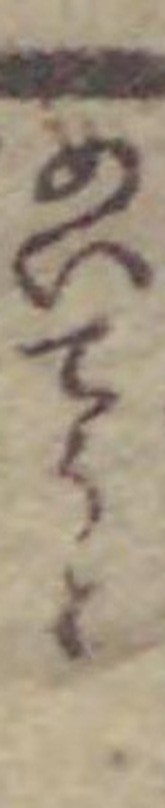めいてうと
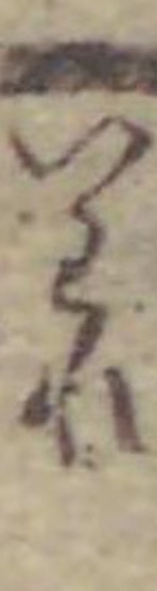いわれ
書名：烏行水諺草 3巻
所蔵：国立国会図書館 National Diet Library, JAPAN
